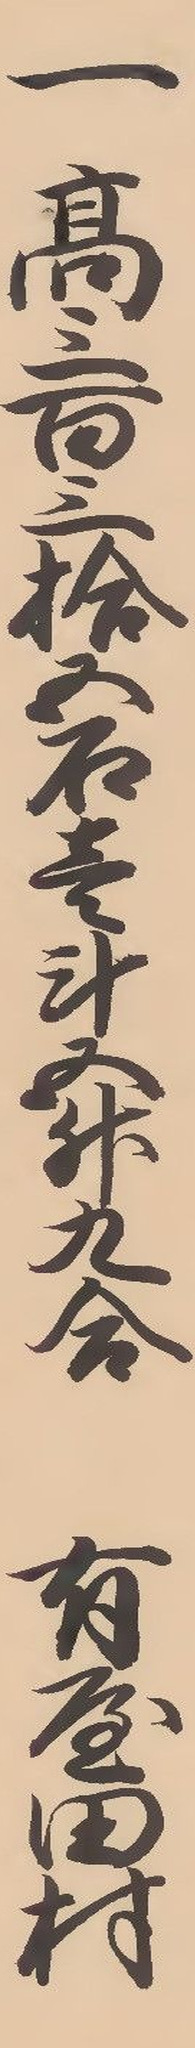一高三百三拾五石壱斗五升九合有屋田村
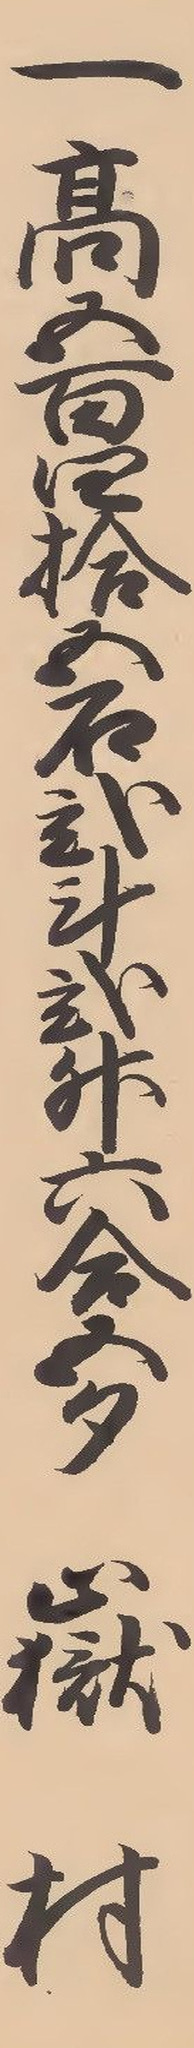一高五百四拾五石弐斗弐升六合五勺嶽村
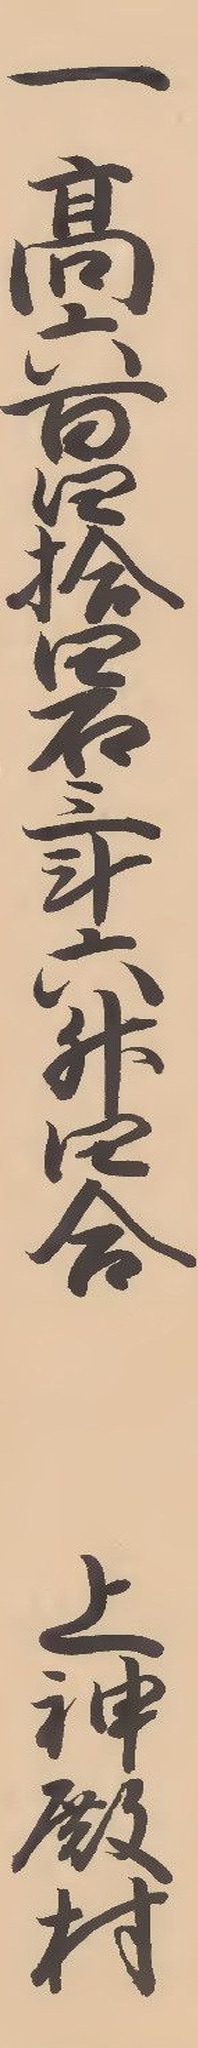一高六百四拾四石三斗六升四合上神殿村
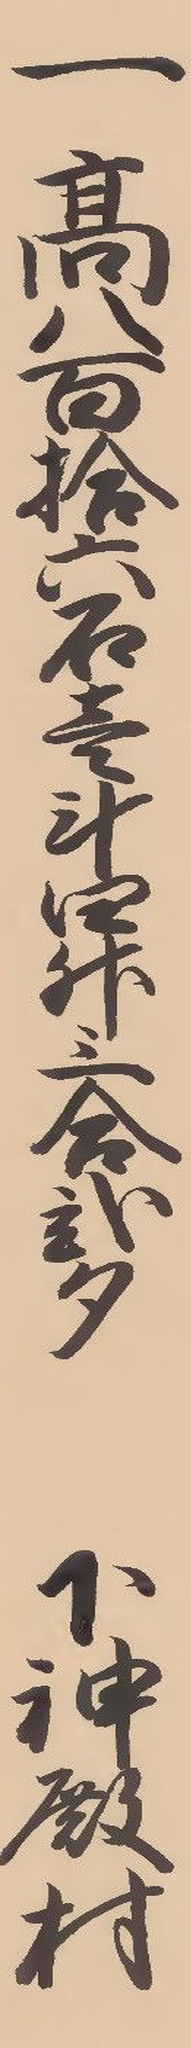一高八百拾六石壱斗四升三合弐勺下神殿村
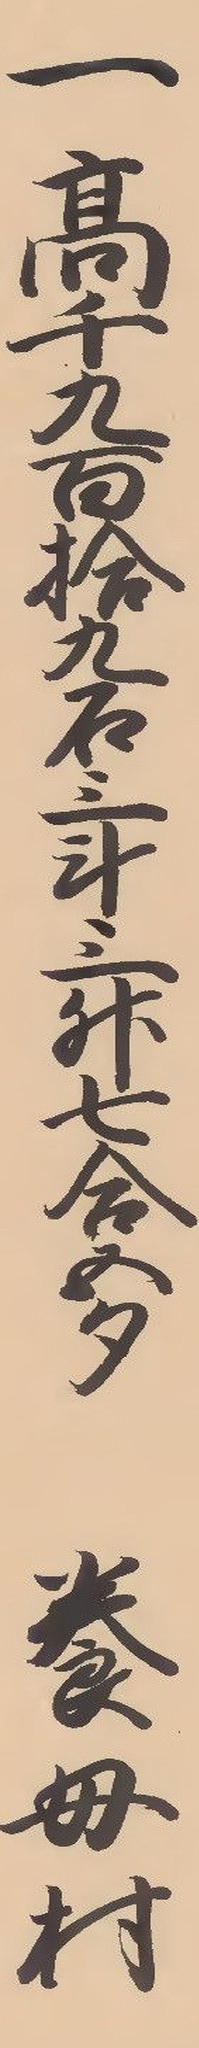一高千九百拾九石三斗三升七合五勺養母村

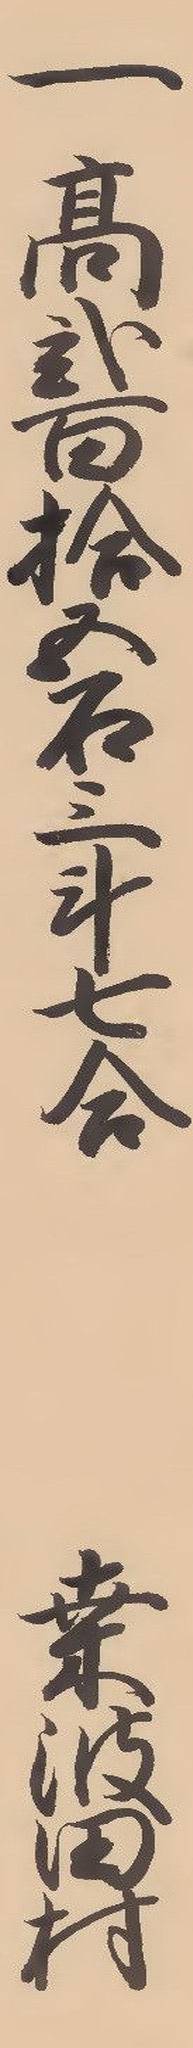一高弐百拾五石三斗七合桑波田村
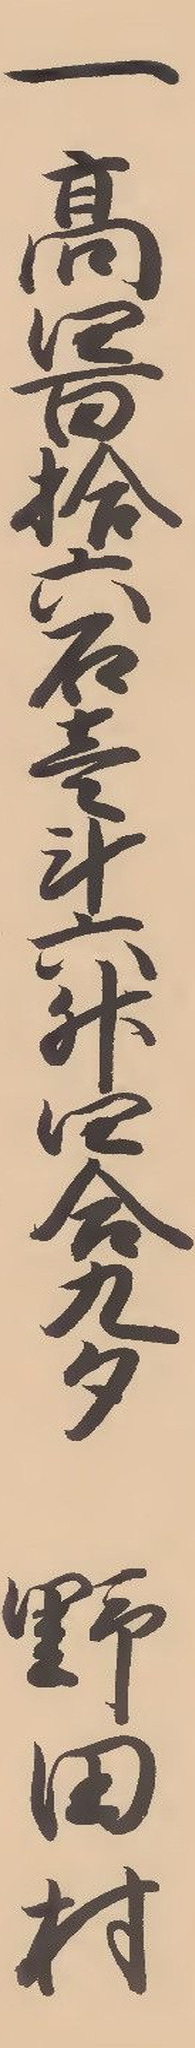一高四百拾六石壱斗六升四合九勺野田村
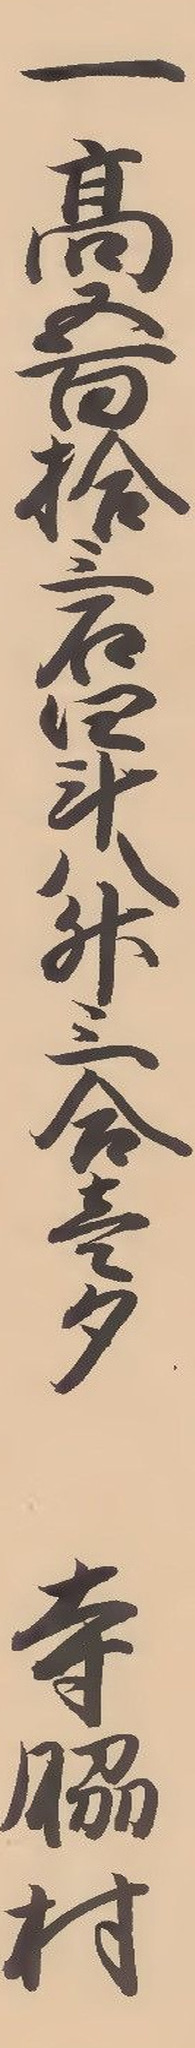一高五百拾三石四斗八升三合壱勺寺脇村
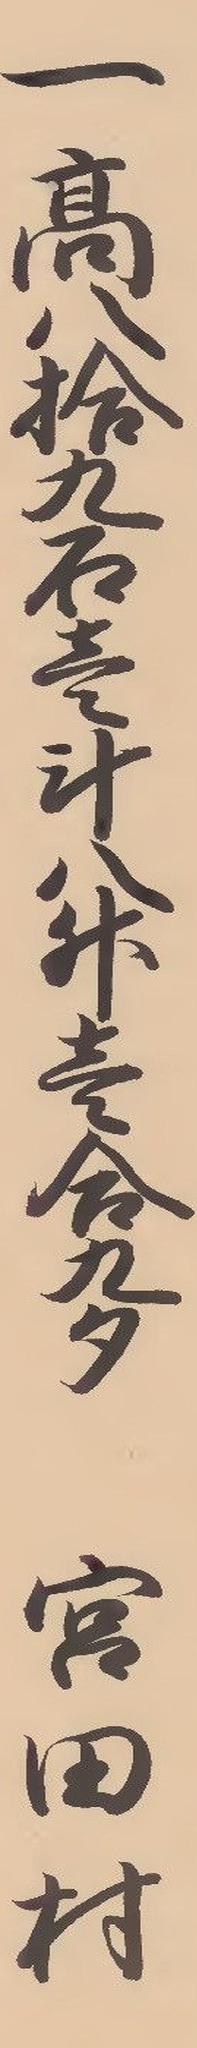一高八拾九石壱斗八升壱合九勺宮太村
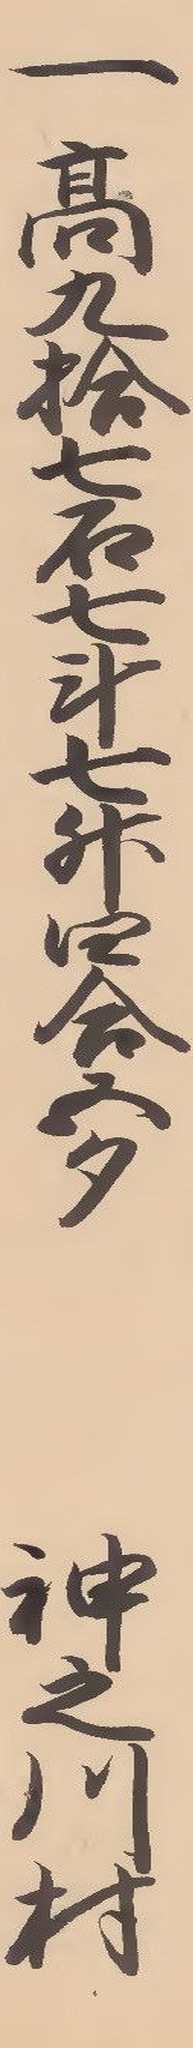一高九拾七石七斗七升四合五勺神之川村
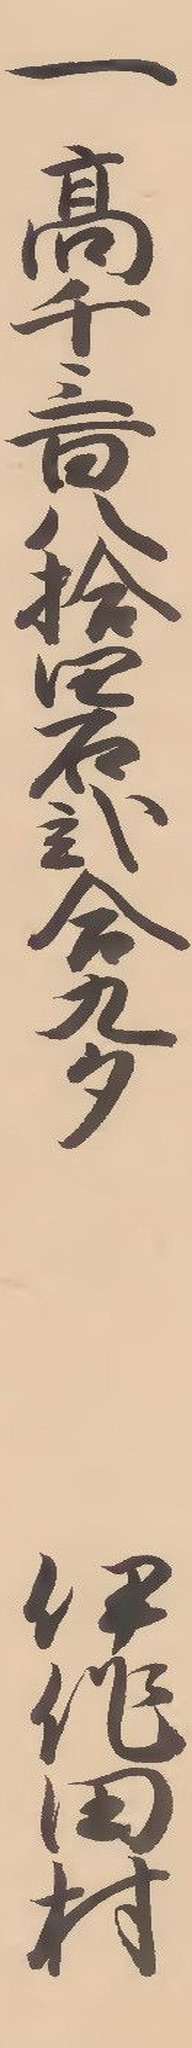一高千三百八拾四石弐合九勺伊作田村
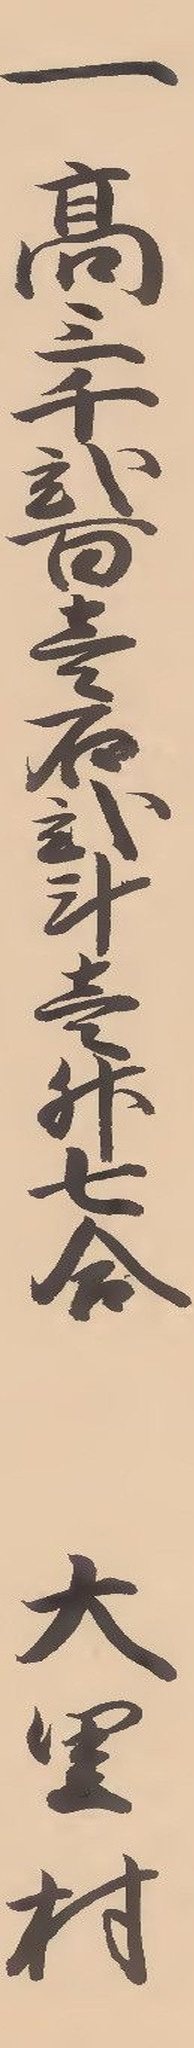一高三千弐百壱石弐斗壱升七合大里村
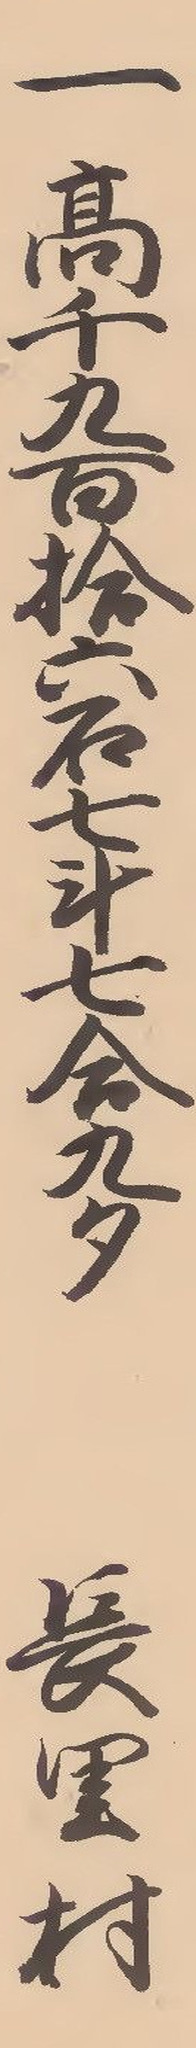一高千九百拾六石七斗七合九勺長里村

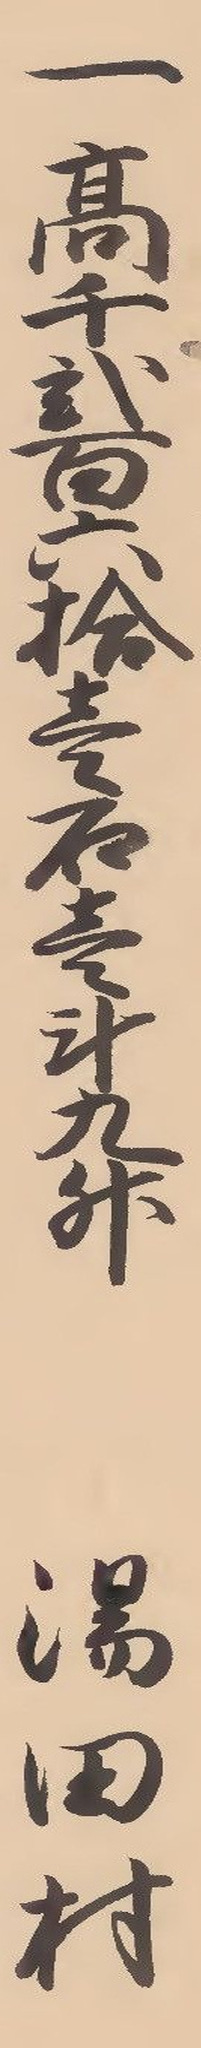一高千弐百六拾壱石壱斗九升湯田村
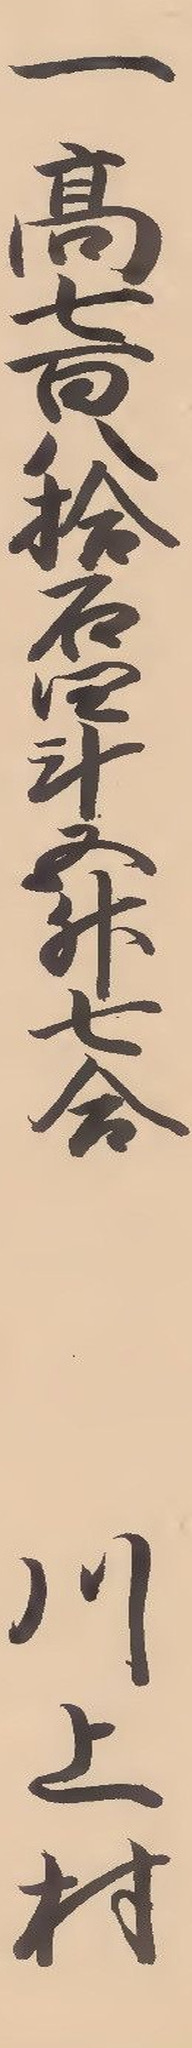一高七百八拾石四斗五升七合川上村
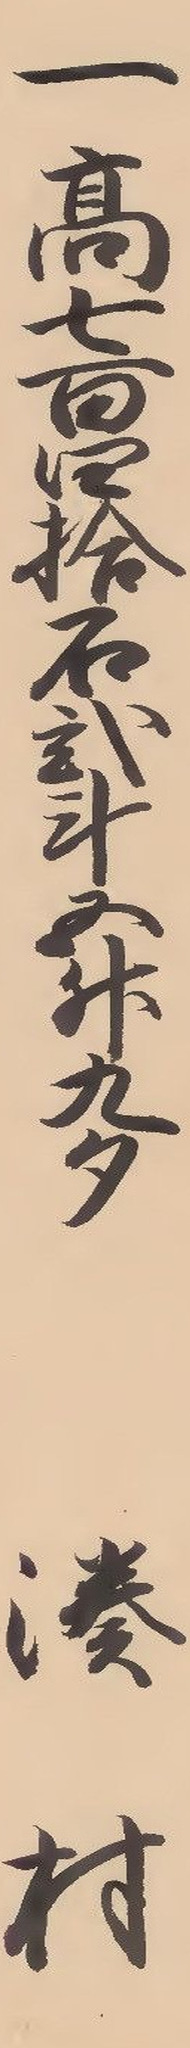一高七百四拾石弐斗五升九勺湊村
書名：薩摩国郷帳
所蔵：国立公文書館 National Archives of Japan
